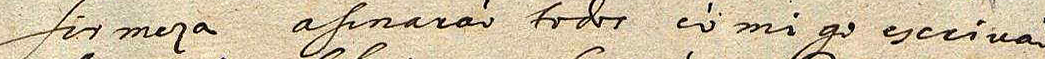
firmeza asinaraõ todos cōmigo escriuaõ
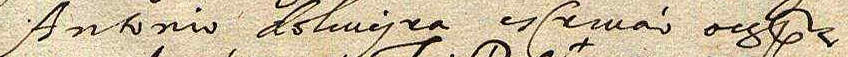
Antonio doliuejra esCriuaõ o esp̄vi
